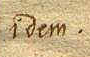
idem.
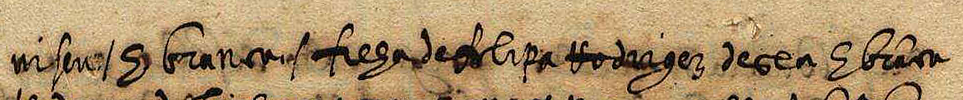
uiseu / E branca / filha de felipa Rodrigez de sea E brāca
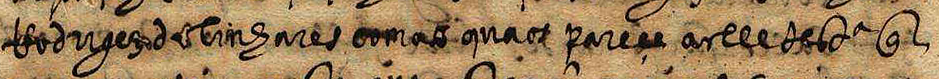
Rodriges de linhares com as quais parece a elle testa q̄
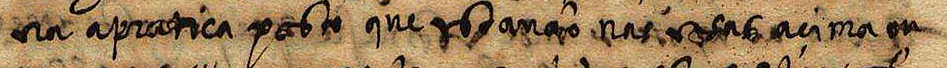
era a pratica posto que estauaõ nas casas acima ou
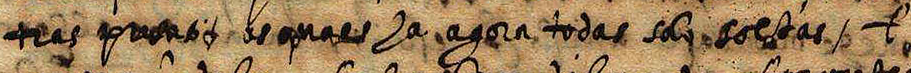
tras presas / as quaes Ja agora todas saõ soltas / E
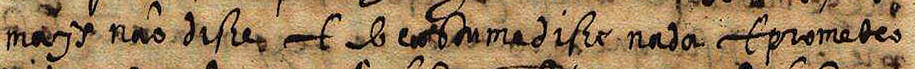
mays naõ disse E do costume disse nada E prometeo
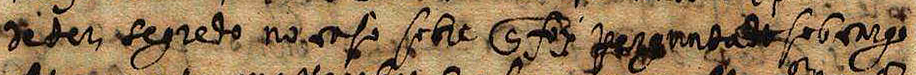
de ter segredo no caso sobre q̄ foy perguntado sob cargo
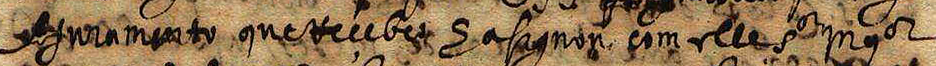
do Juramento que Recebeo E asignou com elle sor jnqor
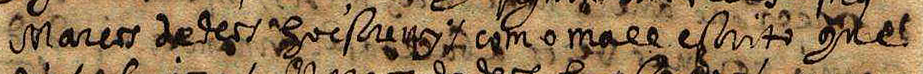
Marcos de deos ho escreuy / com o mall escrito que
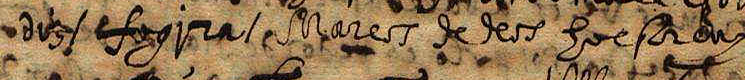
diz / fogjra / Marcos de deos ho escreuj
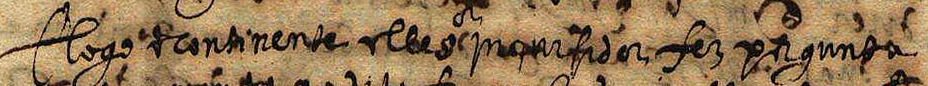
E logo ē continente elle sor jnquisidor fez pergunta
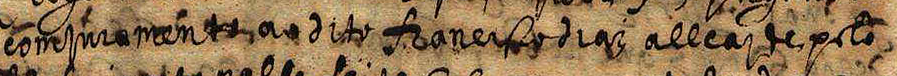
com Juramento ao dito francisco diaz allcajde pelo
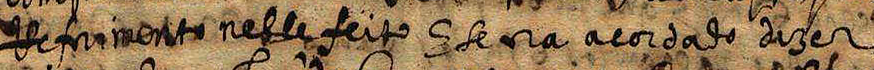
Referimento nelle feito E se era acordado dizer
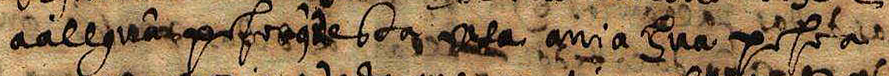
a allguā pesoa q̄ desta casa auia hua pesoa
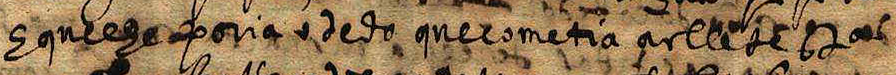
E que lhe poria o dedo que cometia a elle testa
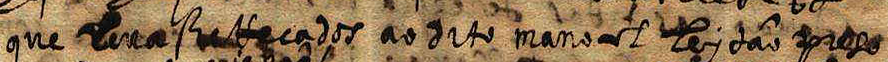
que leuasse Recados ao dito manoel leytaõ preso
